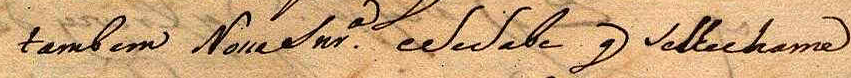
tambem Nossa Snr.a e Se Sabe q̄ se lhe chame
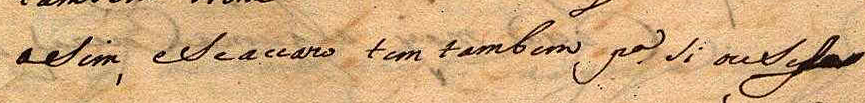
aSim, e Se accazo tem tambem por si ou se fas
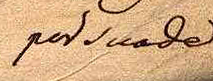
persuade
